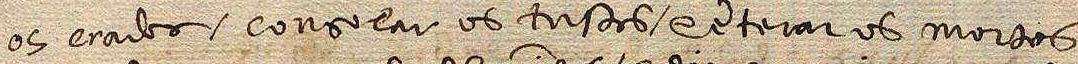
os erados / consolar os tristes / e ēterar os mortos
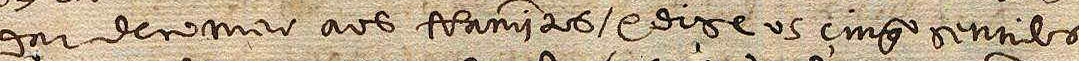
dar de comer aos ffamj̄tos / e dise os çimq̄o sentidos
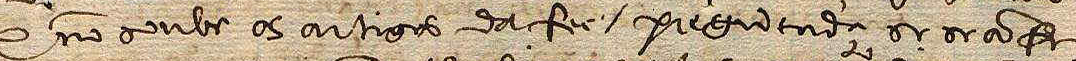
e n̄o soube os artigos da fee / pregūtada se se cōfe
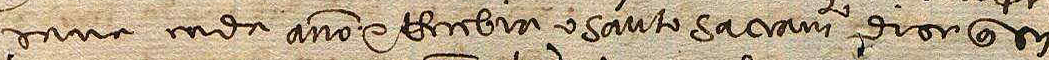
saua cada an̄o e Recebia o santo sacramto dise q̄ sy
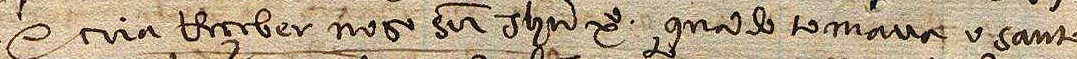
e cria Reçeber noso s̄or Jhū xo. quādo tomaua o santo
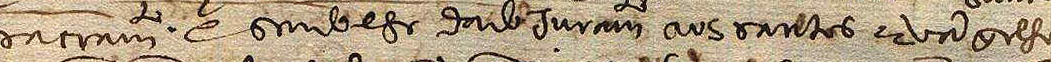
sacramto. e sendolhe dado Juramto aos santos evāgelho
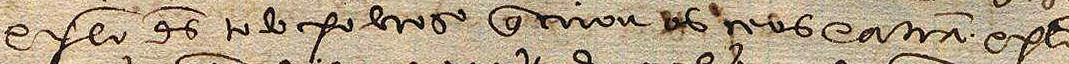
e pl̄o d̄s todo poderoso q̄ criou os çeos e a trā. e pl̄o
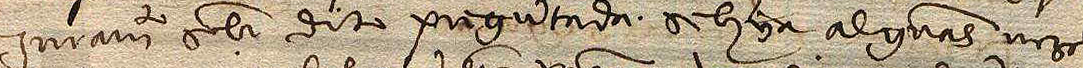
Juramto sōbr dito pregūtada. se hya algūas uezes
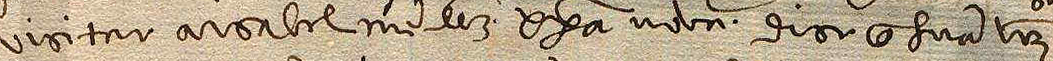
visitar a isabel mēdez. xp̄a nova. dise q̄ huā vez
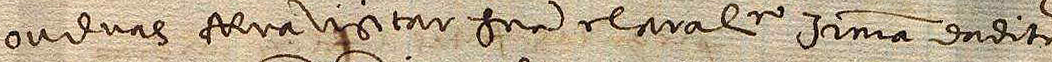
ou duas ffora visitar huā clara lco Jrm̄a da dita
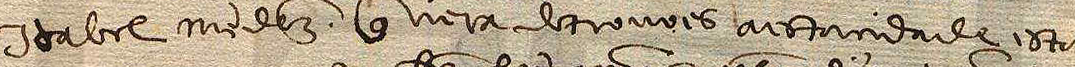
Jsabel mēdez. q̄ viera de trouoes a esta çidade esta
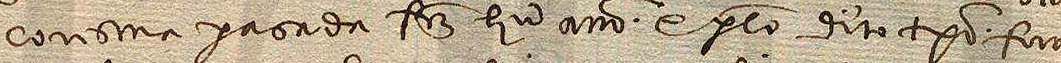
coresma pasada fez hū anō. e p̄lo dito tpō. fora
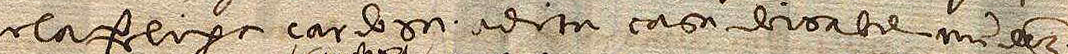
ela felipa cardosa. a dita casa de isabel mēdez
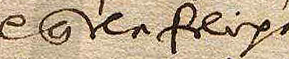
e q̄ ela felipa
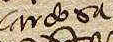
cardosa
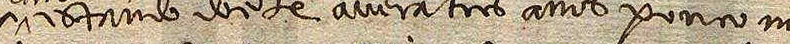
estando doēte auera tres anōs pouco m
